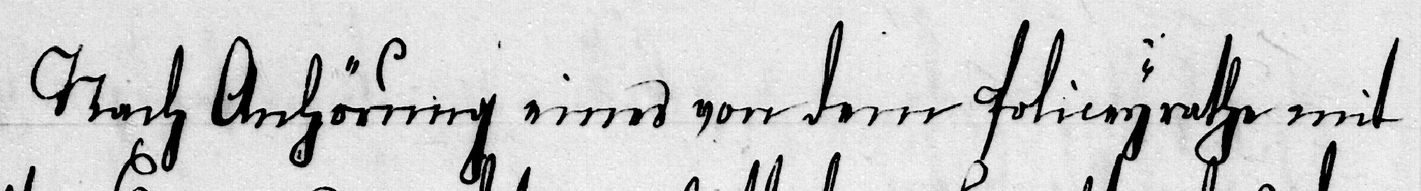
Nach Anhörung eines von dem Policeyrathe mit
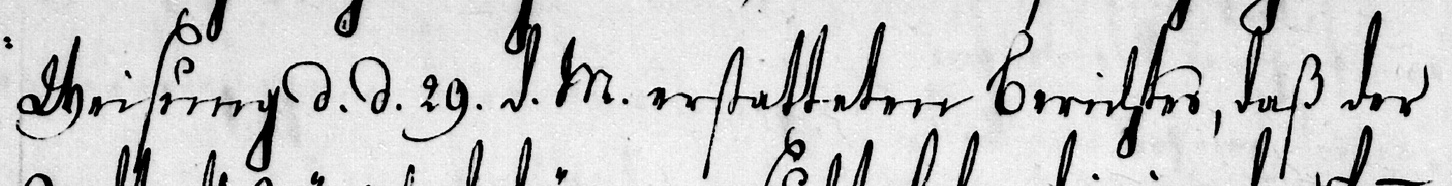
Weisung d. d. 29. d. M. erstatteten Berichtes, daß der
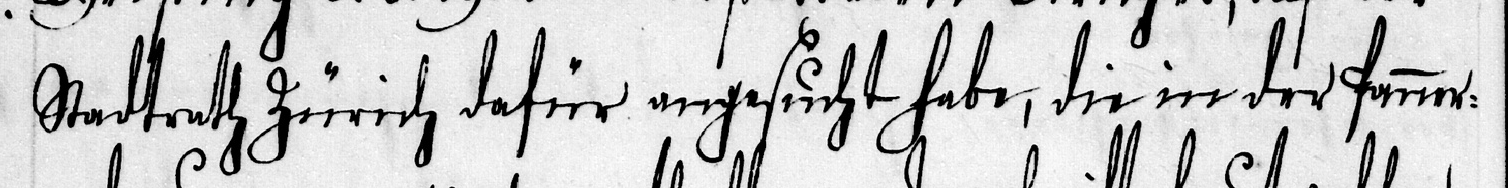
Stadtrath Zürich dafür angesucht habe, die in der Panne¬
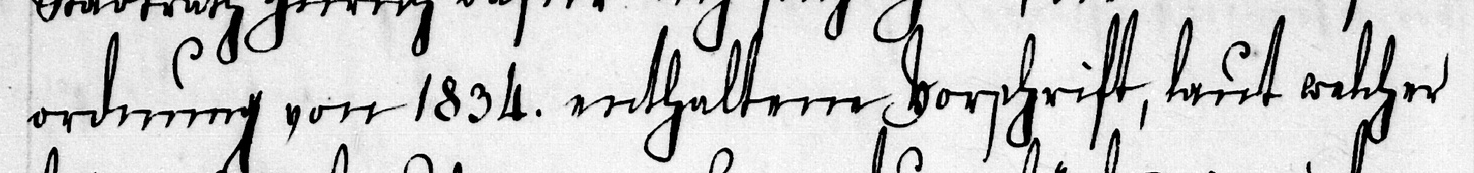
rordnung von 1834. enthaltene Vorschrift, laut welcher
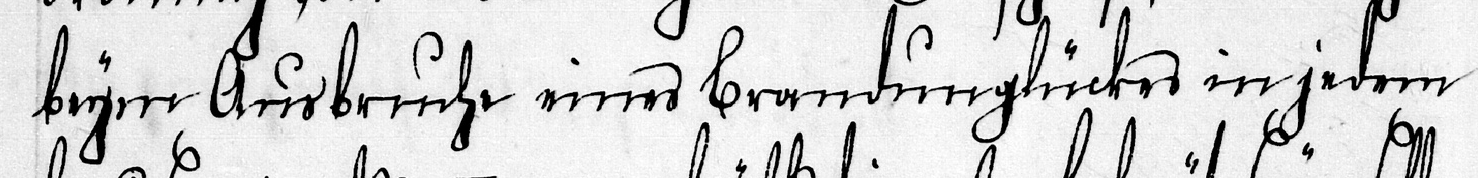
beym Ausbruche eines Brandunglückes in jedem
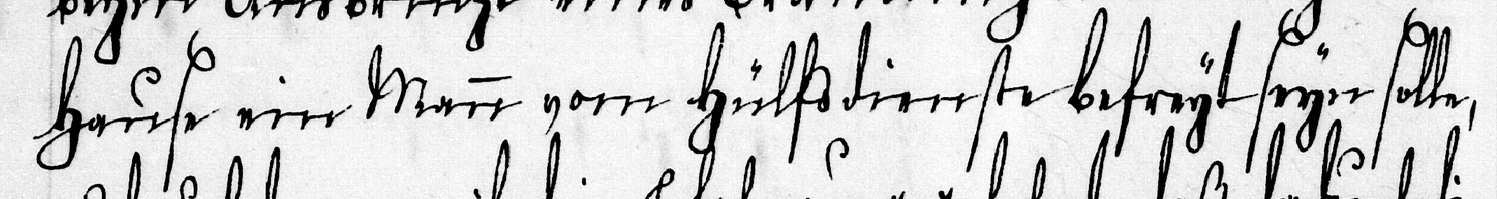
Hause ein Mann vom Hülfsdienste befreyt seyn soll¬
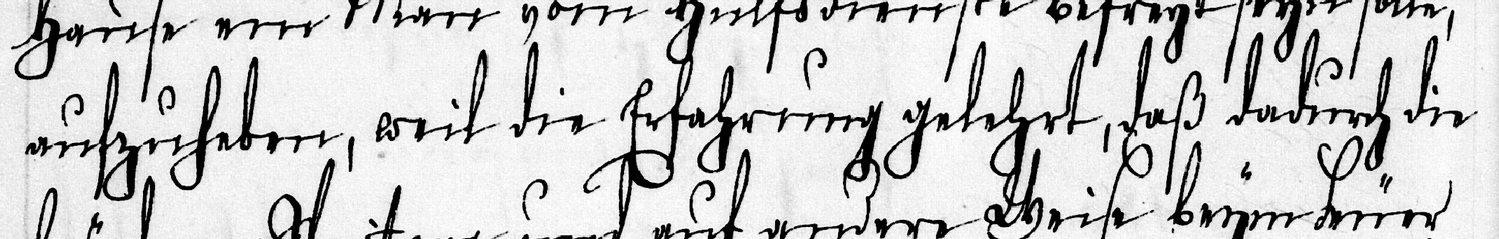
aufzuheben, weil die Erfahrung gelehrt, daß dadurch die
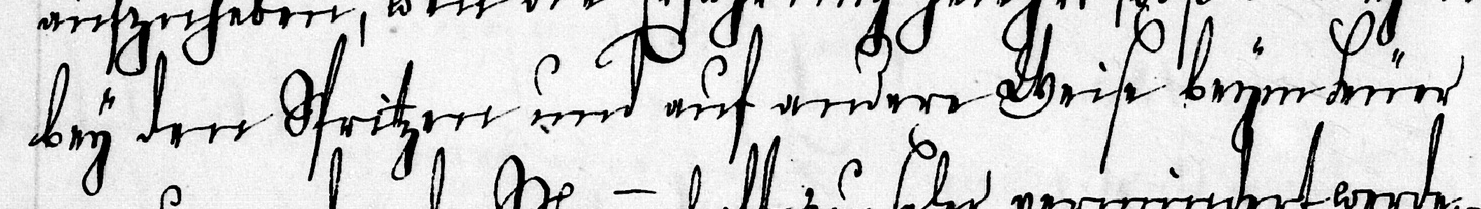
bey den Spritzen und auf andere Weise beym Feuer
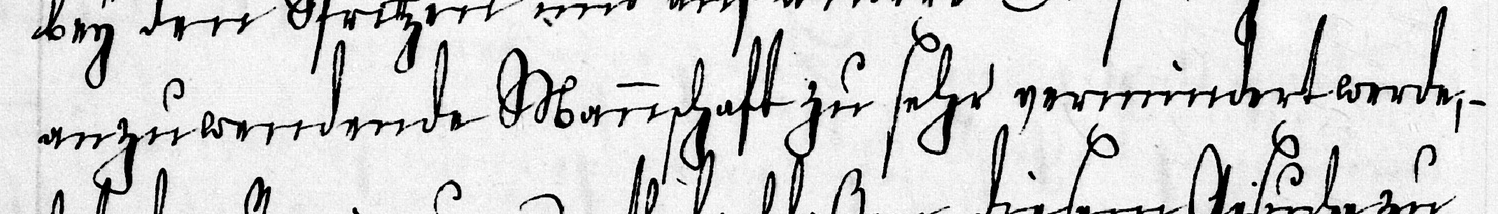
anzuwendende Mannschaft zu sehr vermindert werde,
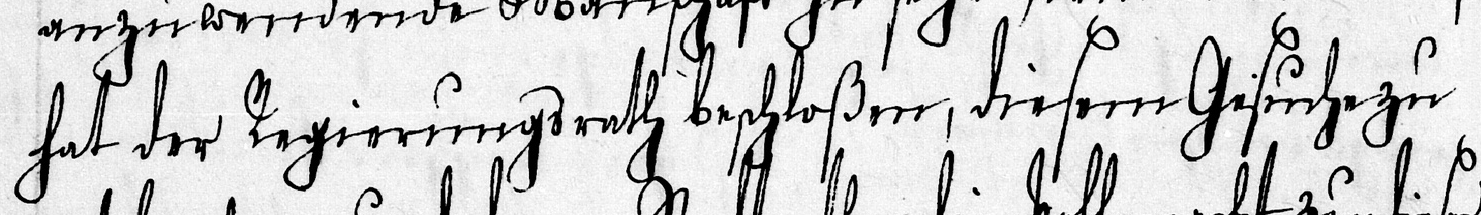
hat der Regierungsrath beschloßen, diesem Gesuche zu
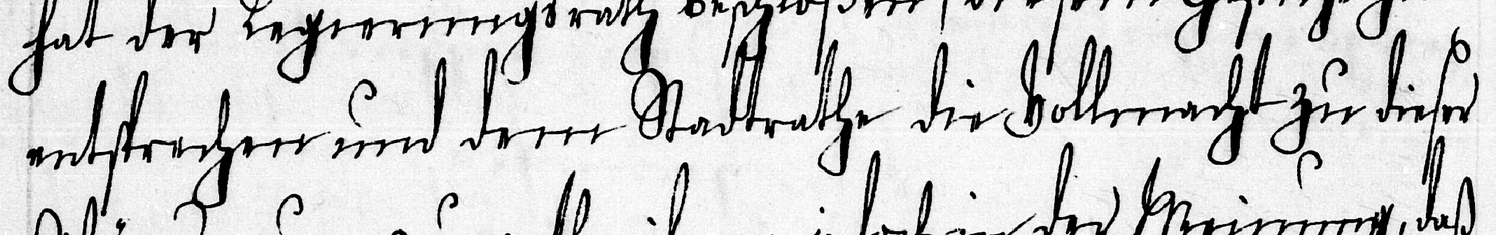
entsprechen und dem Stadtrathe die Vollmacht zu dies¬
